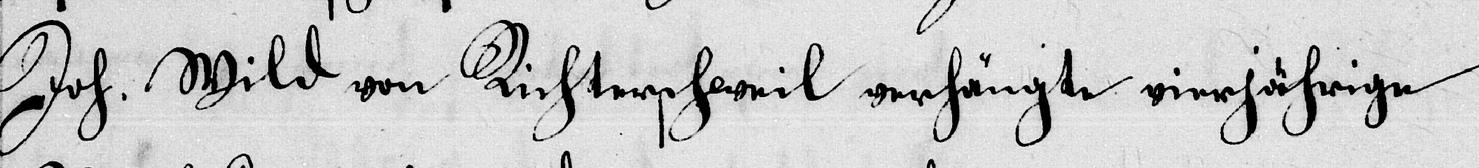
Joh. Wild von Richterschweil verhängte vierjährige
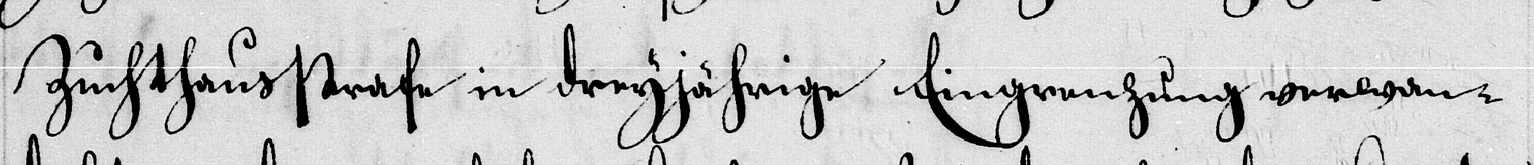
Zuchthausstrafe in dreyjährige Eingrenzung verwan¬
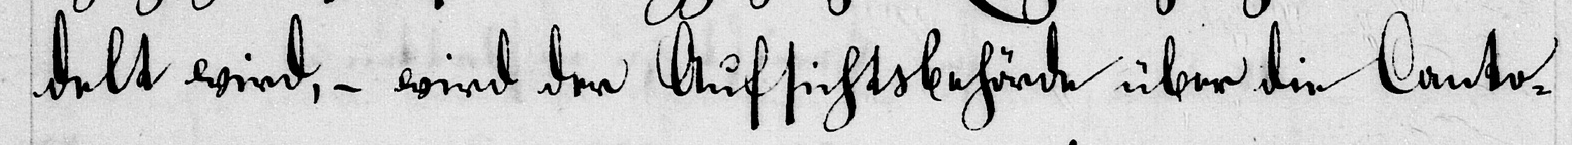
delt wird, – wird der Aufsichtsbehörde über die Canto¬
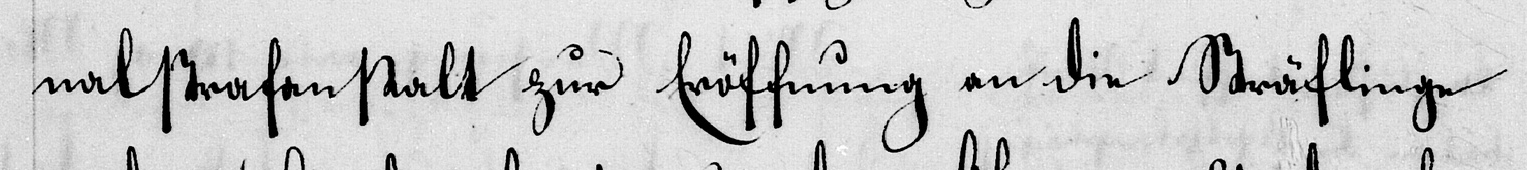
nalstrafanstalt zur Eröffnung an die Sträflinge
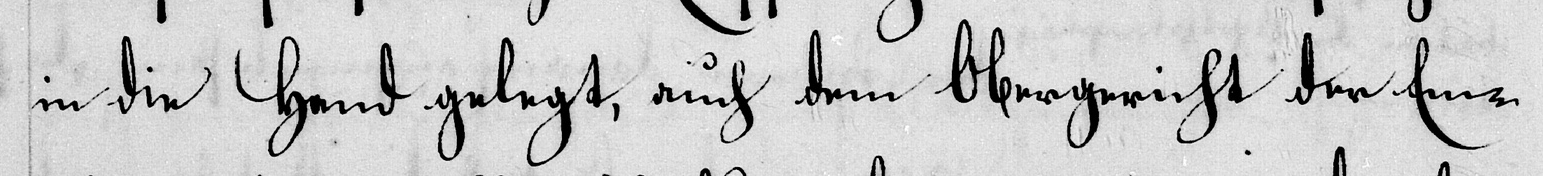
in die Hand gelegt, auch dem Obergericht der Em¬
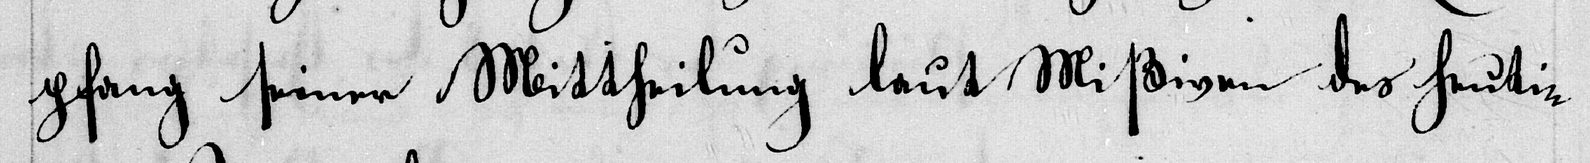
pfang seiner Mittheilung laut Mißiven des heuti¬
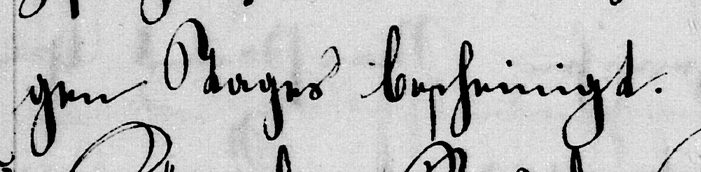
gen Tages bescheinigt.
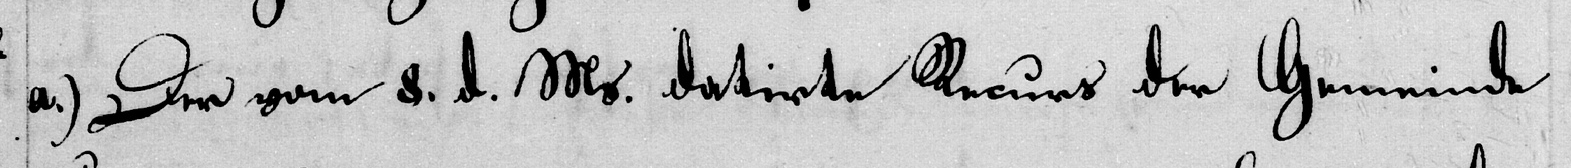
a.) Der vom 8. d. Ms. datirte Recurs der Gemeinde
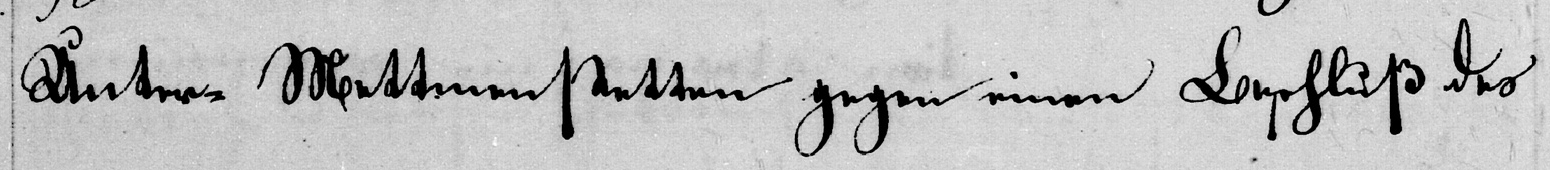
Unter-Mettmenstetten gegen einen Beschluß des
